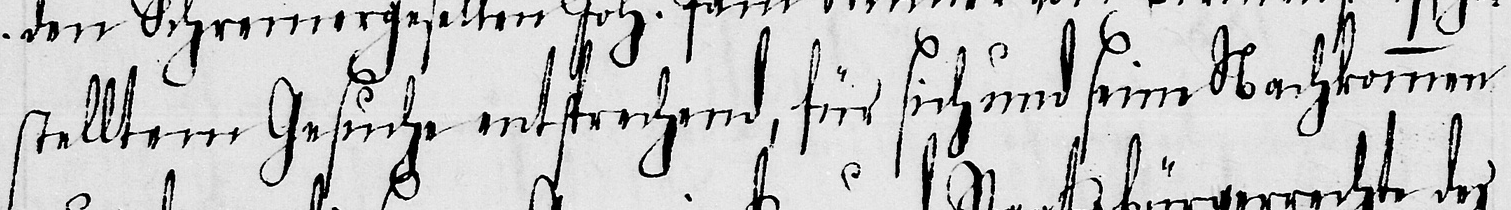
stelltem Gesuche entsprechend, für sich und seine Nachkommen
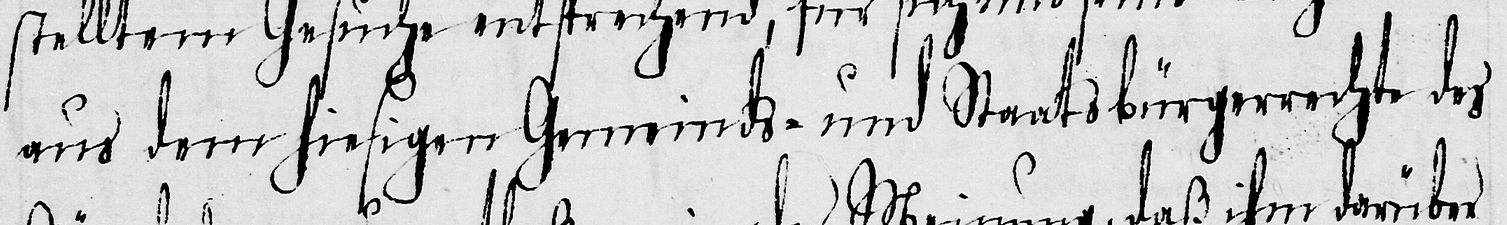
aus dem hiesigen Gemeinds- und Bürgerrecht des
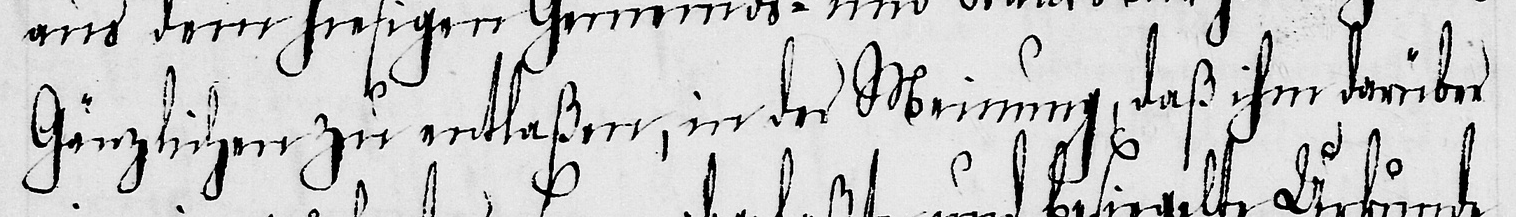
Gänzlichen zu entlaßen, in der Meinung, daß ihm darüber
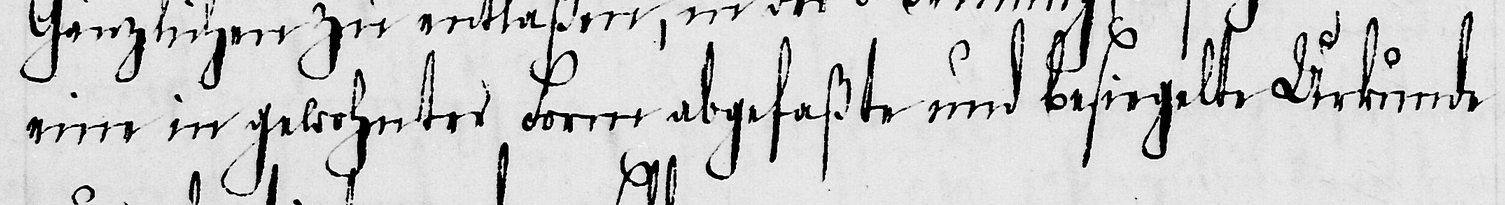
eine in gewohnter Form abgefaßte und besiegelte Urkunde
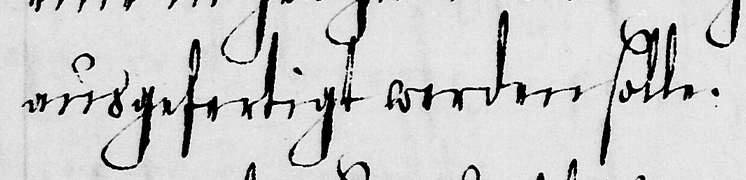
ausgefertigt werden solle.
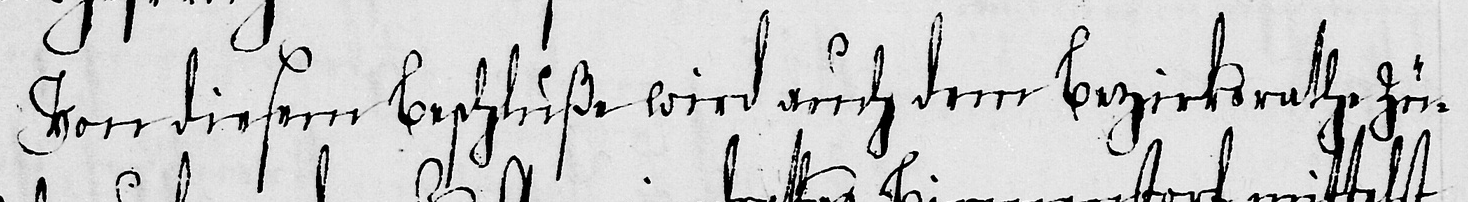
Von diesem Beschluße wird auch dem Bezirksrathe Zü¬
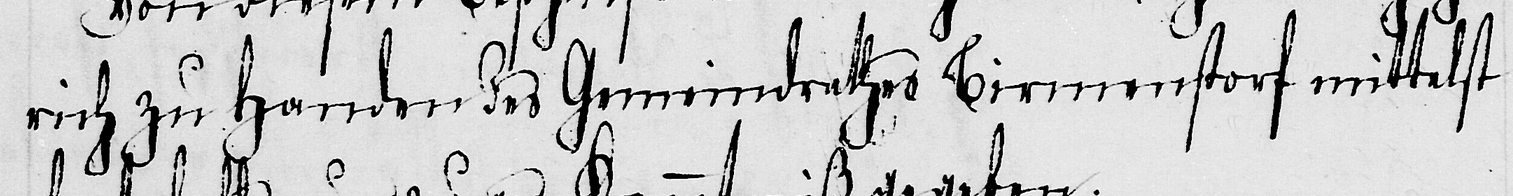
rich zu Handen des Gemeindrathes Birmenstorf mittelst
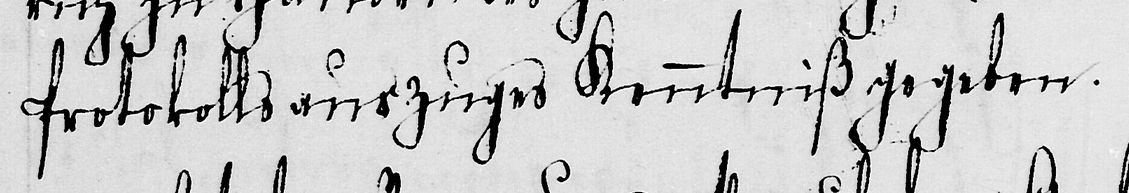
Protokollsauszuges Kenntniß gegeben.
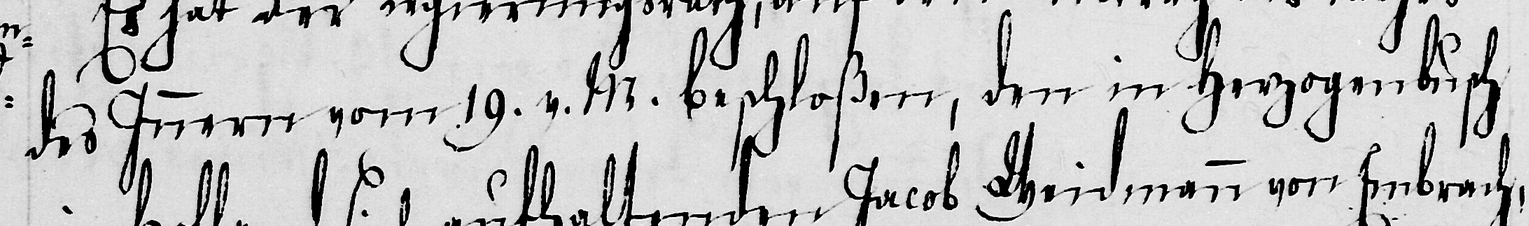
des Innern vom 19. v. M. beschloßen, den in Herzogenbusch
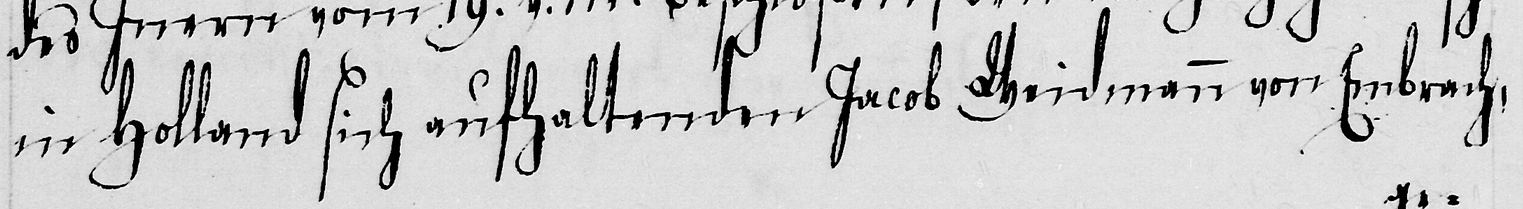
in Holland sich aufhaltenden Jacob Weidmann von Embrach,
